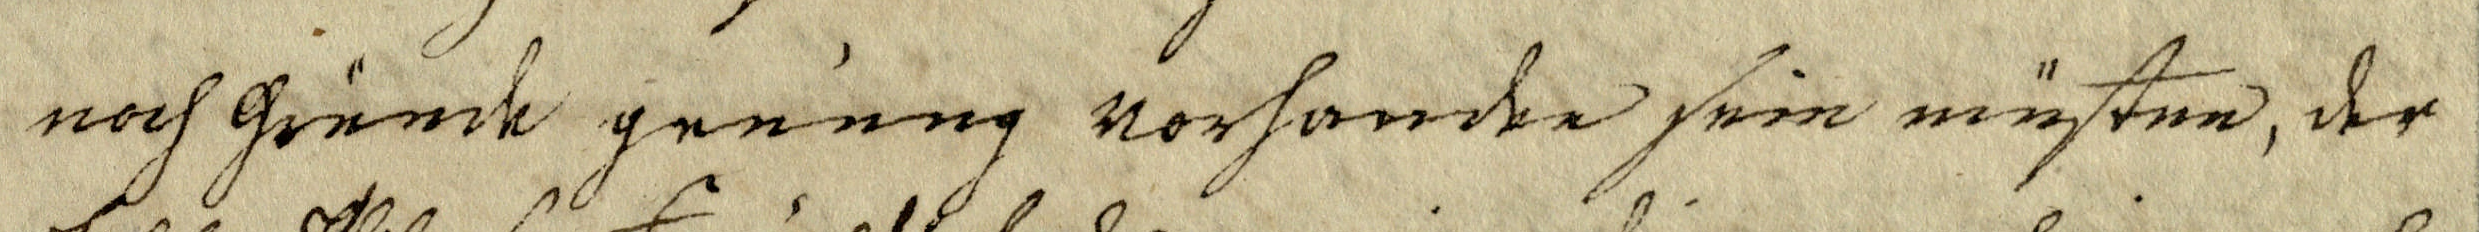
noch Gründe genung vorhanden sein müsten, der
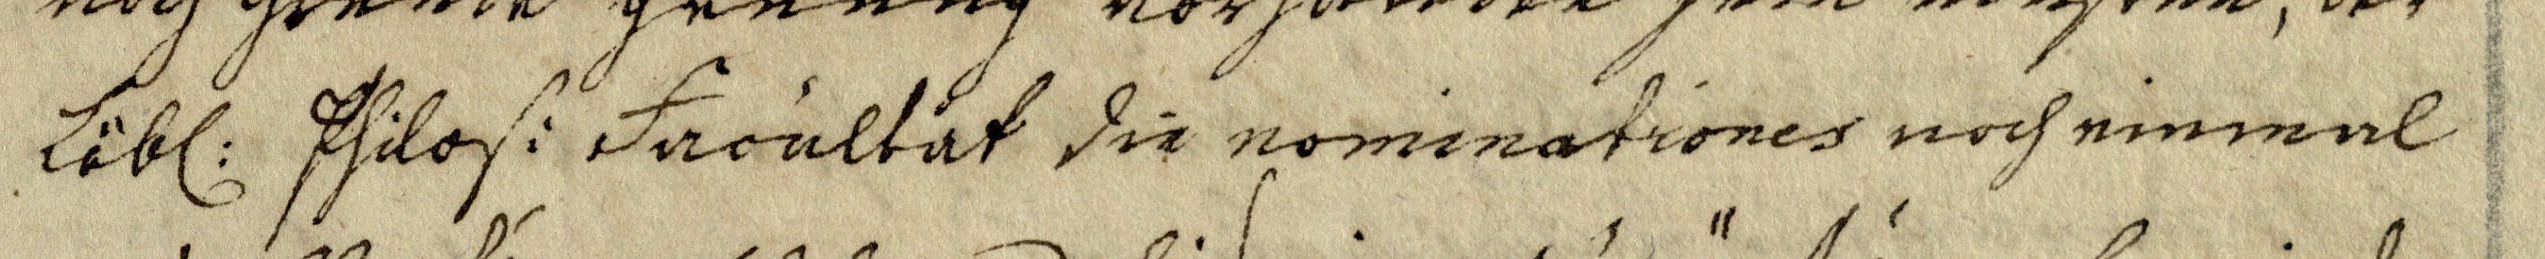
Löbl. Philos. Facultät die nominationes noch einmal
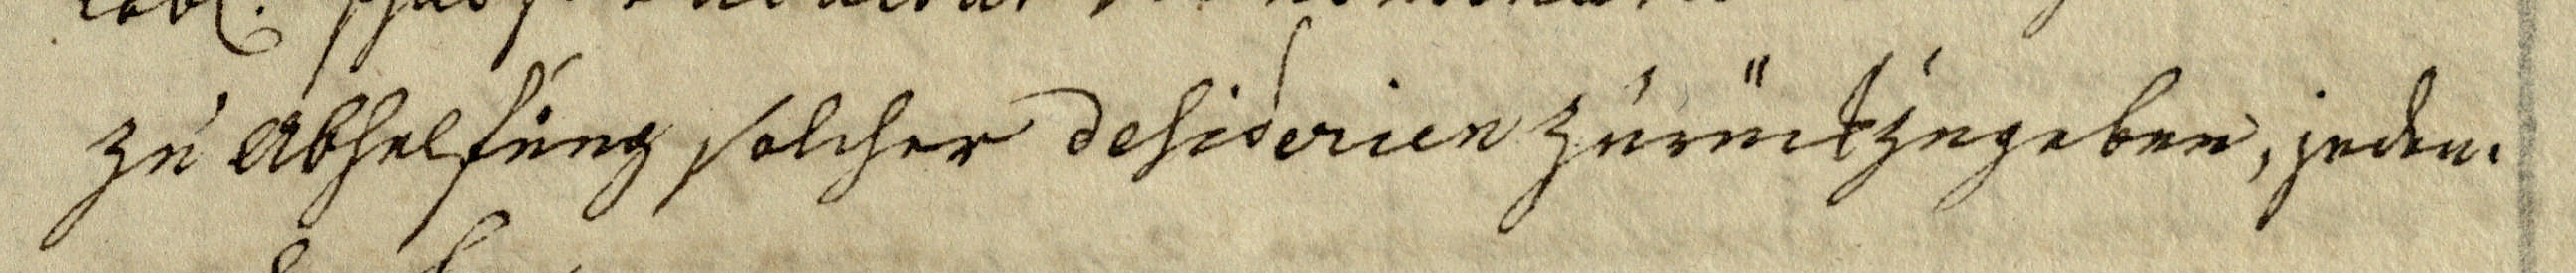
zu Abhelfung solcher desiderien zurückgegeben, jeden¬
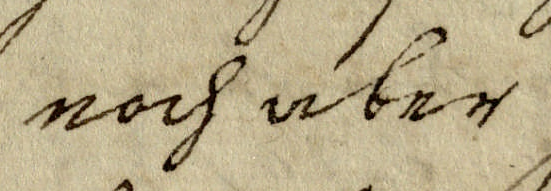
noch aber
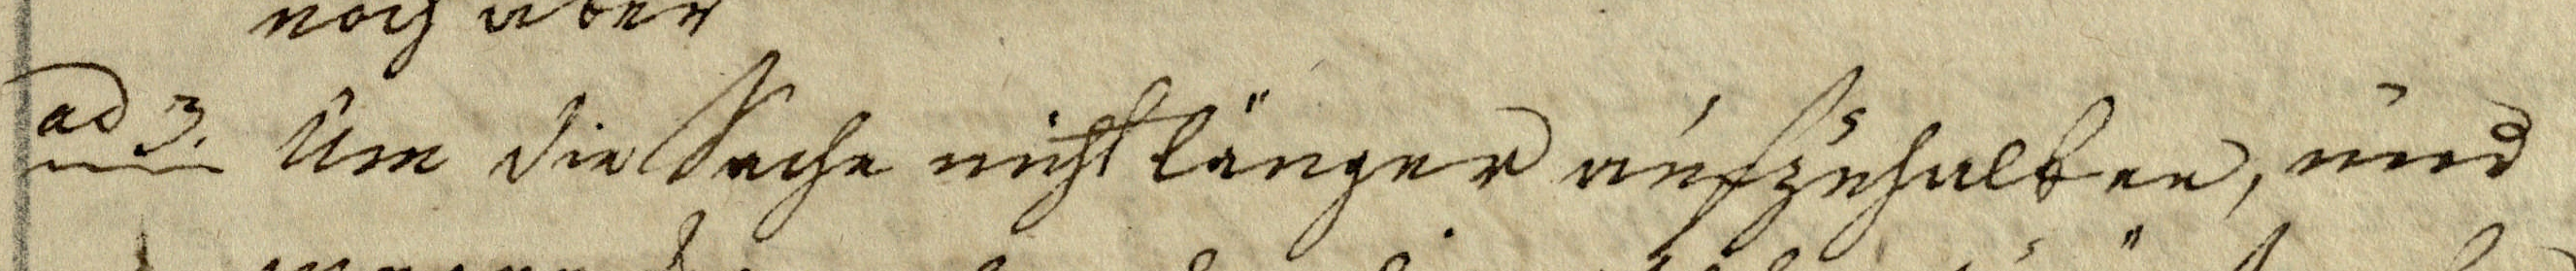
ad 3. Um die Sache nicht länger aufzuhalten, und
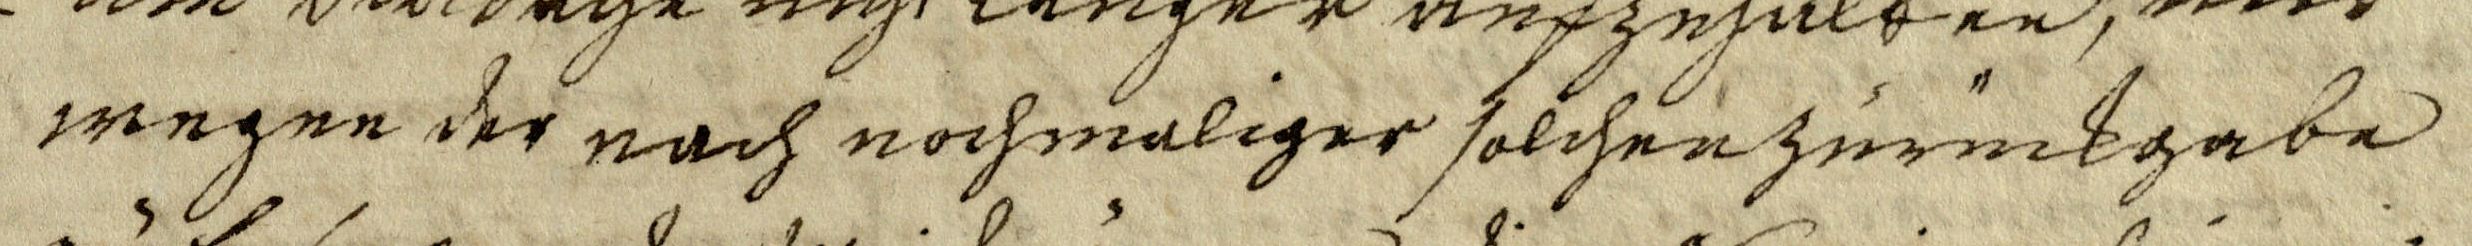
wegen der nach nochmaliger solchen Zurückgabe
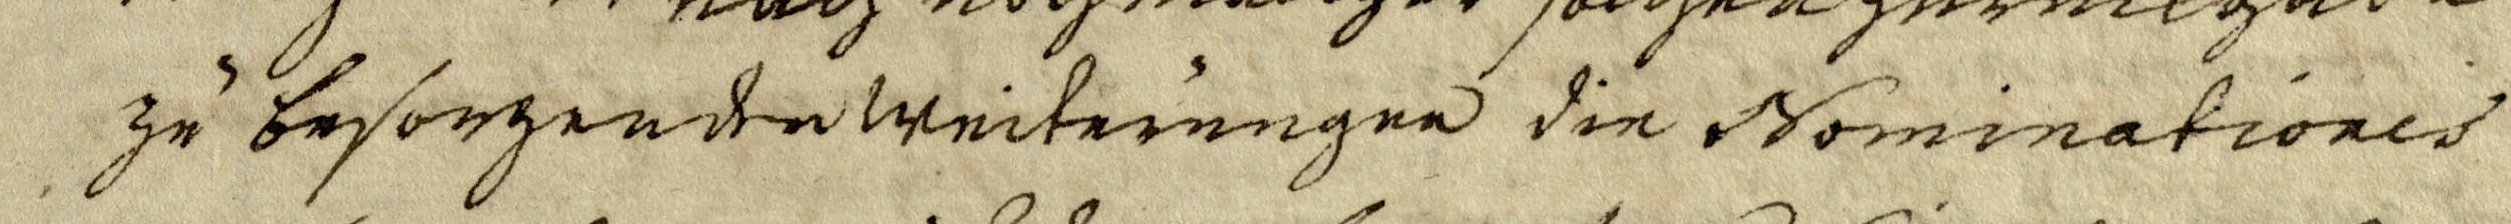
zu besorgenden Weiterungen die Nominationis
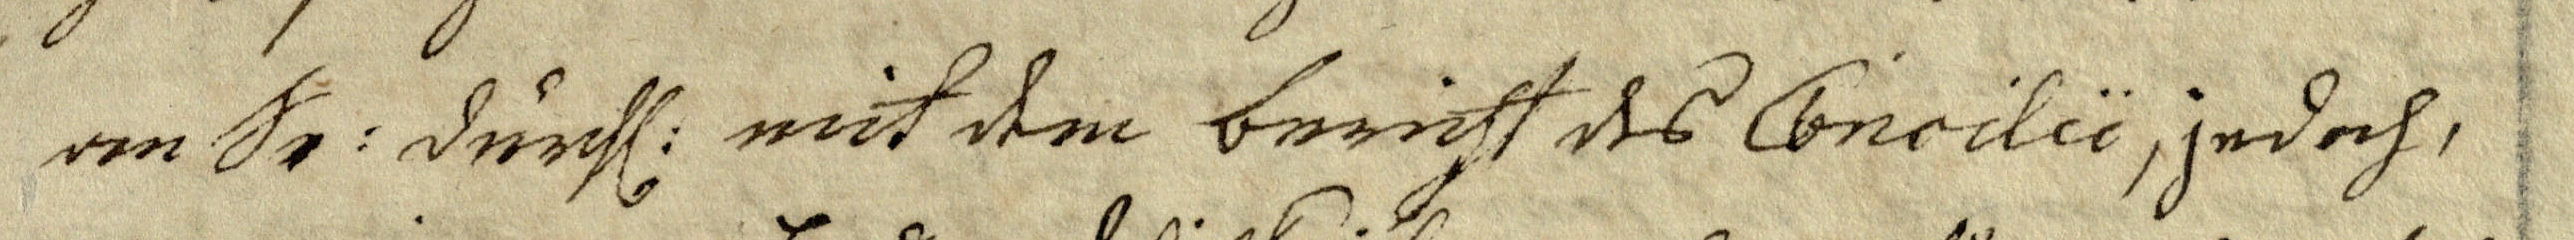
an Sr Durchl. mit dem Bericht des Concilii, jedoch
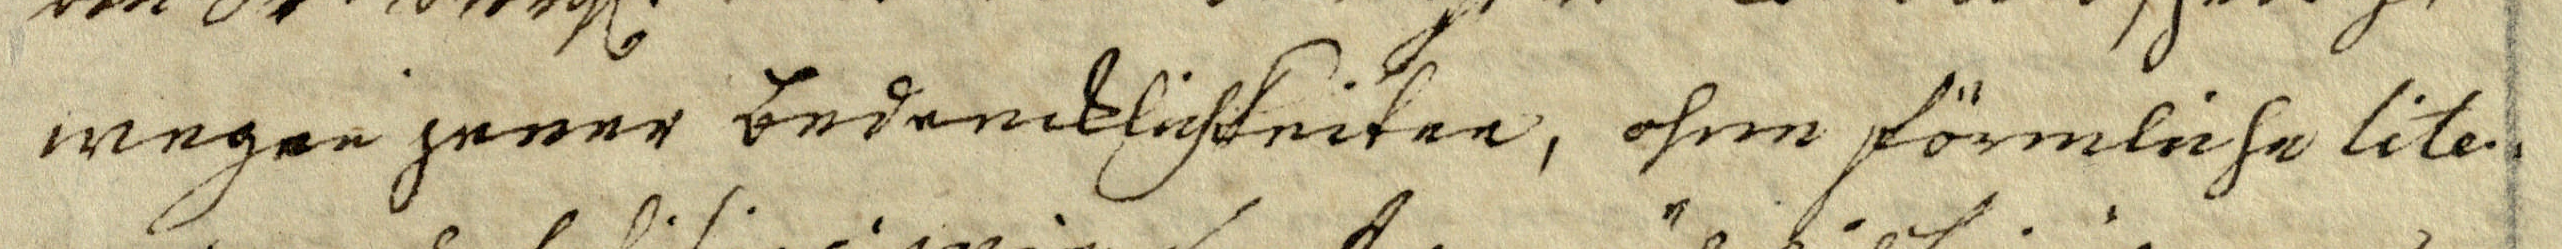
wegen jener Bedenklichkeiten, ohne förmliche lite¬
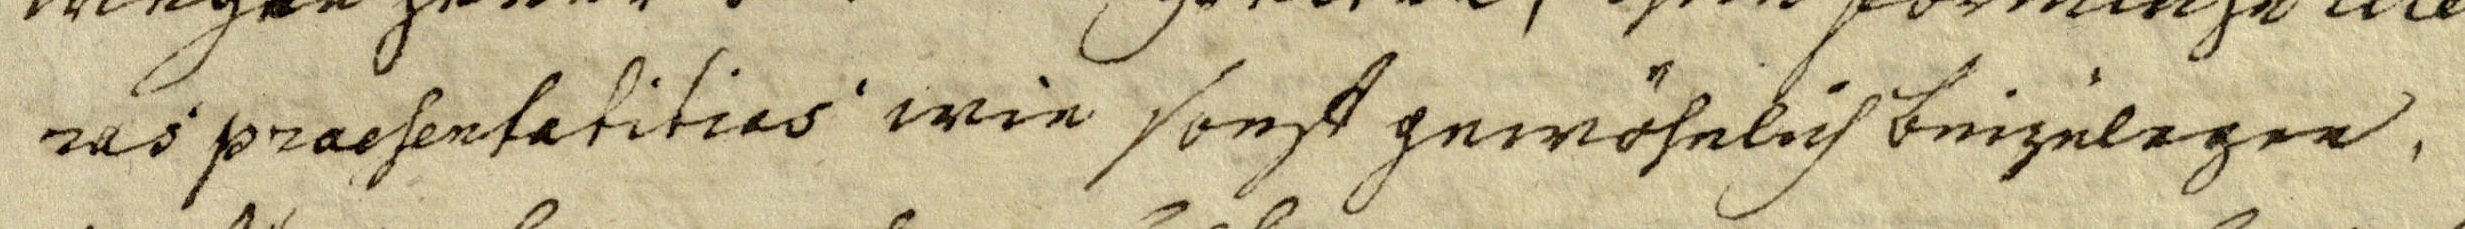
ras praesentatitiis wie sonst gewöhnlich beizulegen,
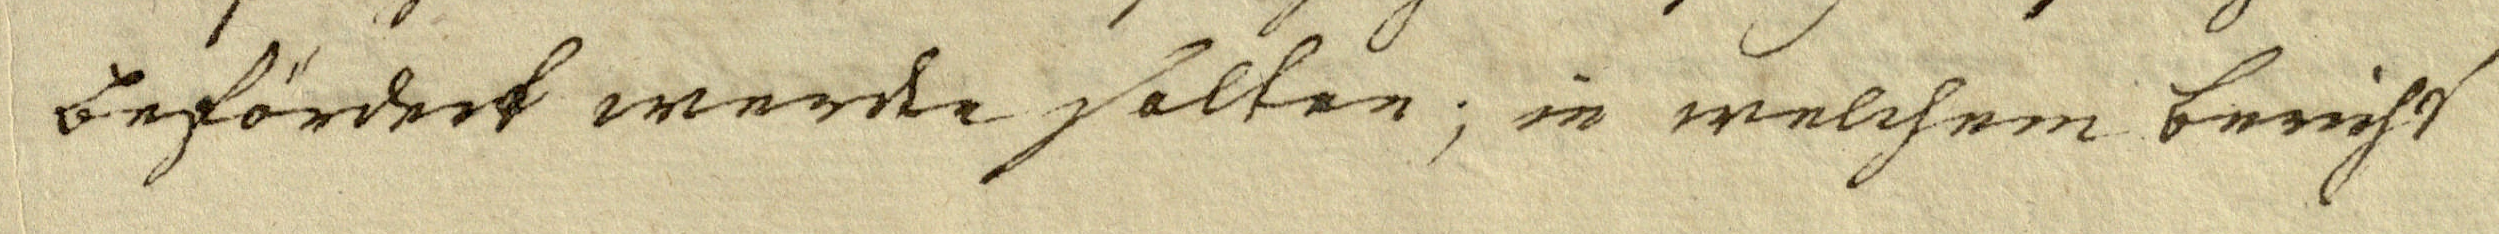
befördert werden solten, in welchem Bericht
